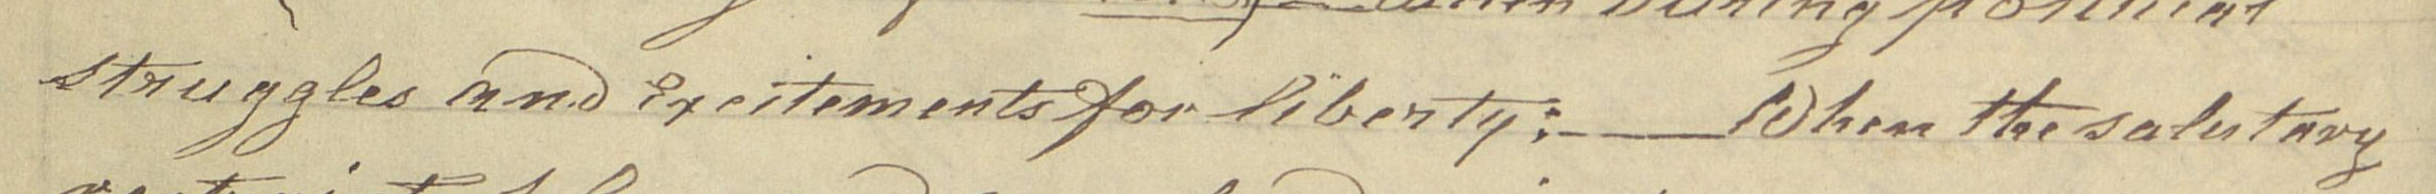struggles and Excitements for liberty; when the salutary
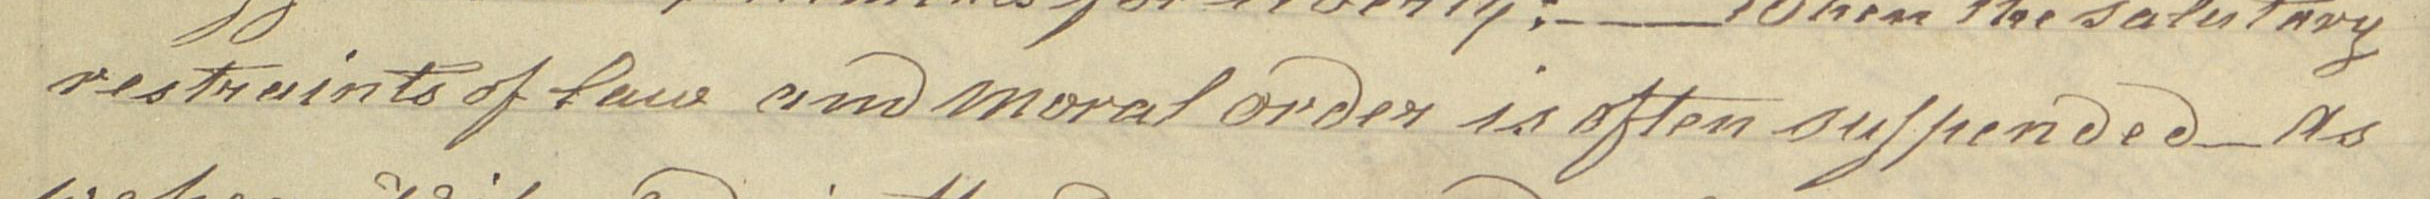restraints of law and moral order is often suspended. As
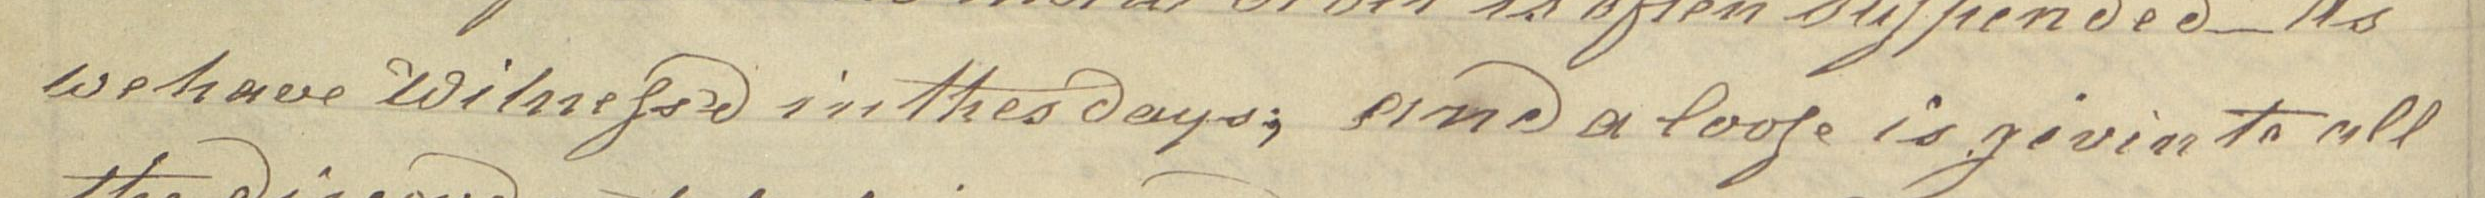we have Witnessd in thes days; and a loose is givin to all
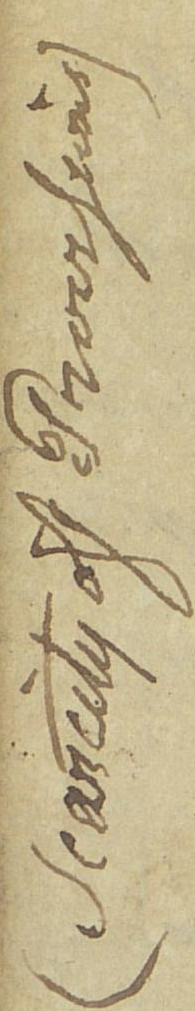Scarcity of Provisions
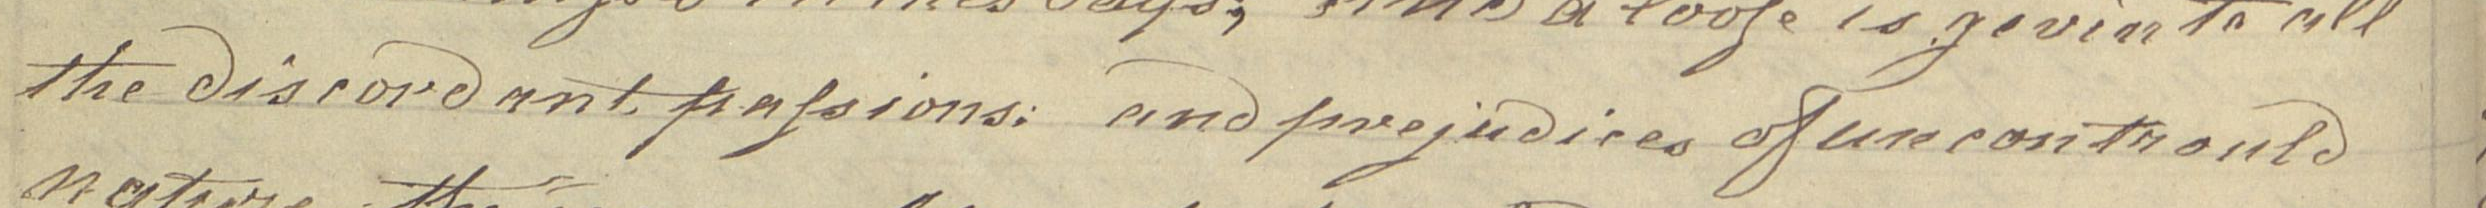the discordant passions. and prejudices of uncontrould
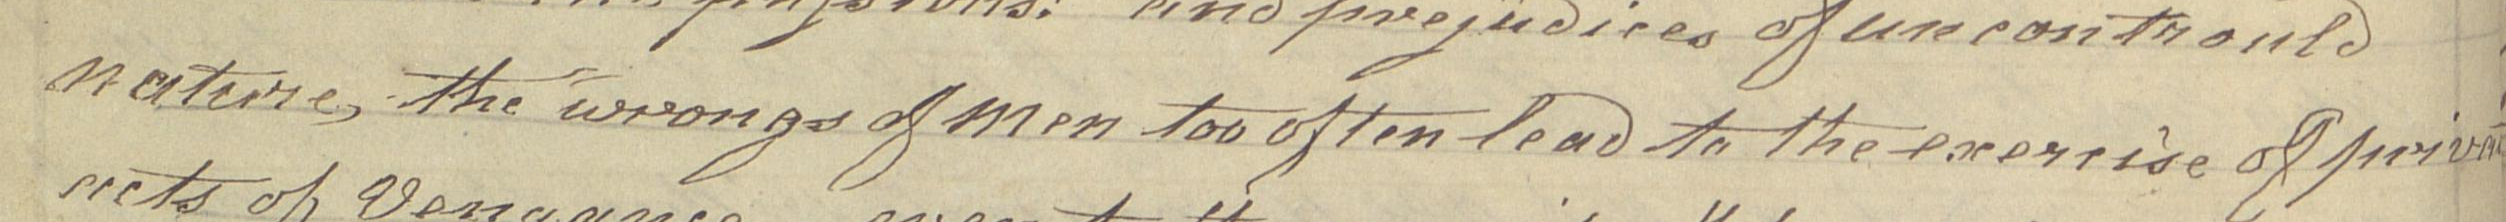nature the wrongs of men too often lead to tho exercise of priv-
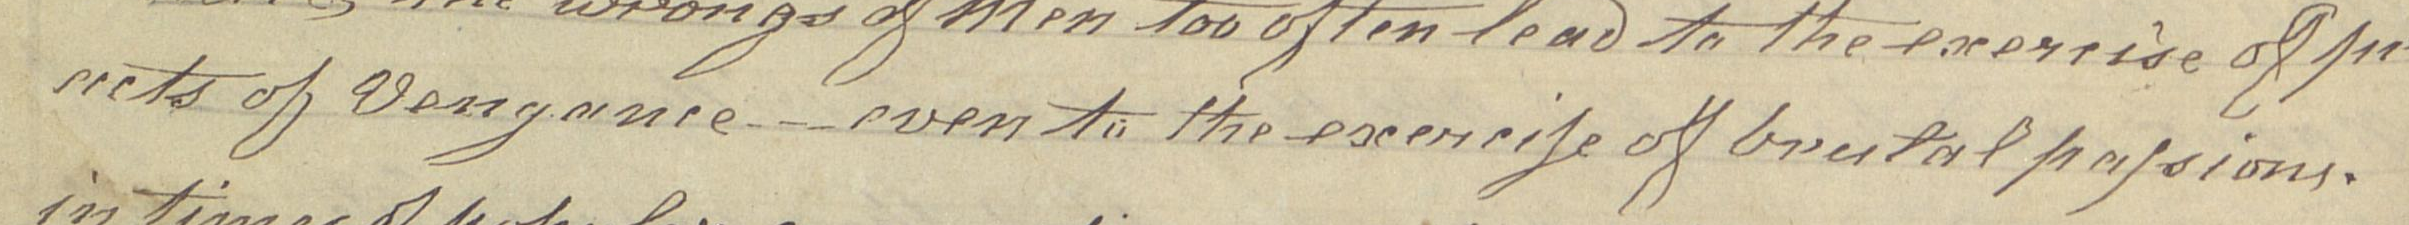acts of Vengance, even to the exercise of brutal passions.
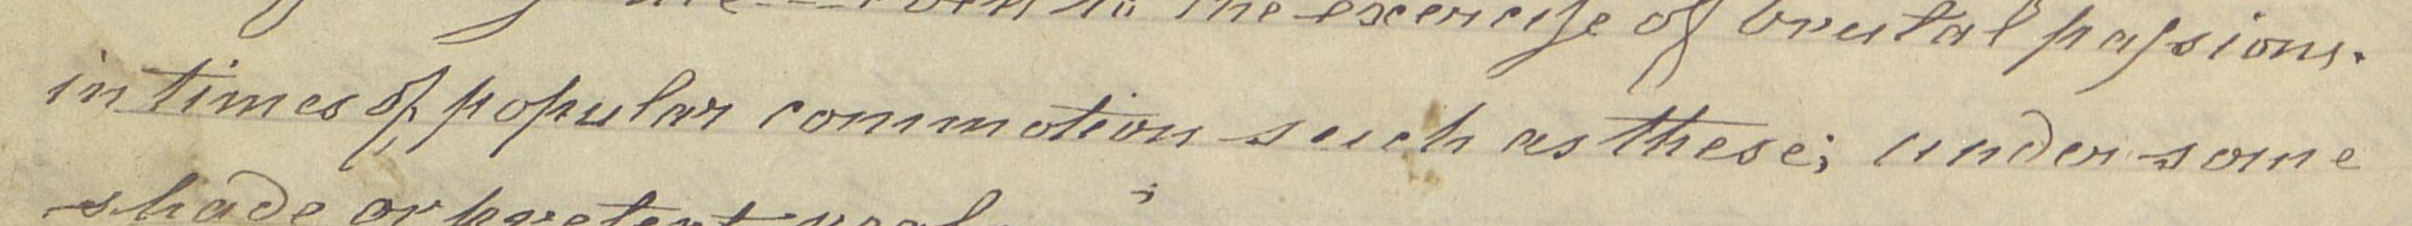in times of popular commotion such as these; under some
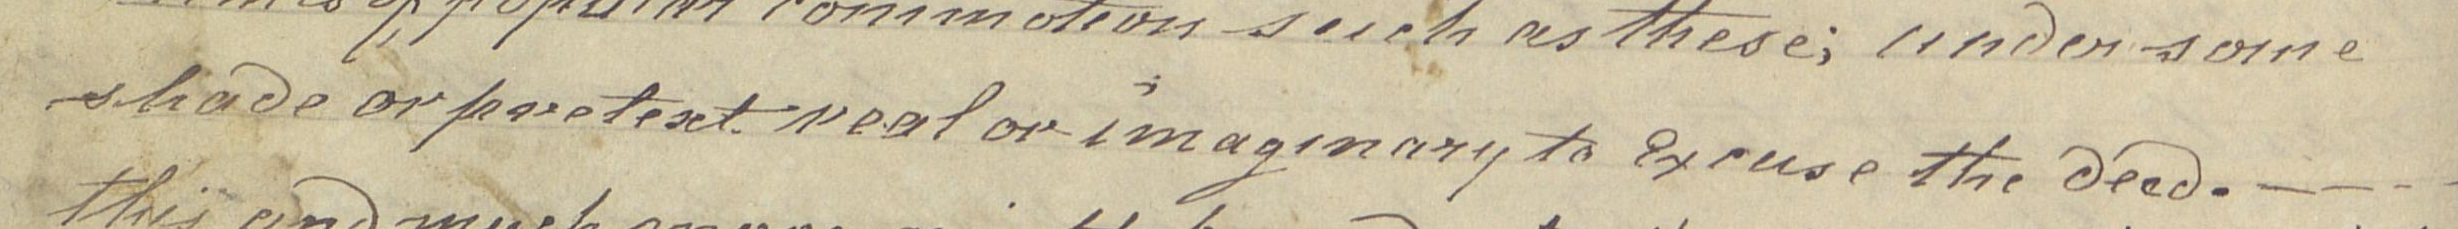shade or pretext real or imaginary to Excuse the deed.
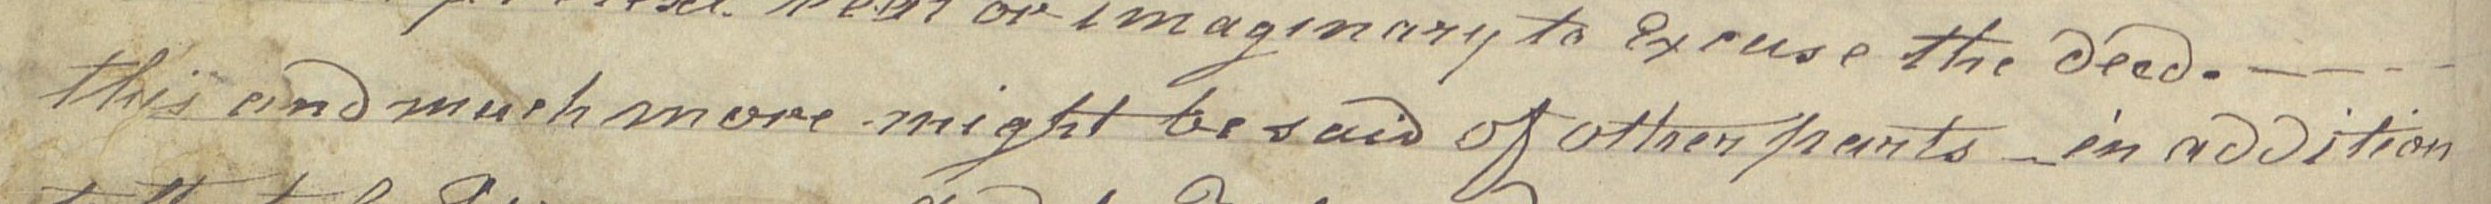this and much more might be said of other parts, in addition
